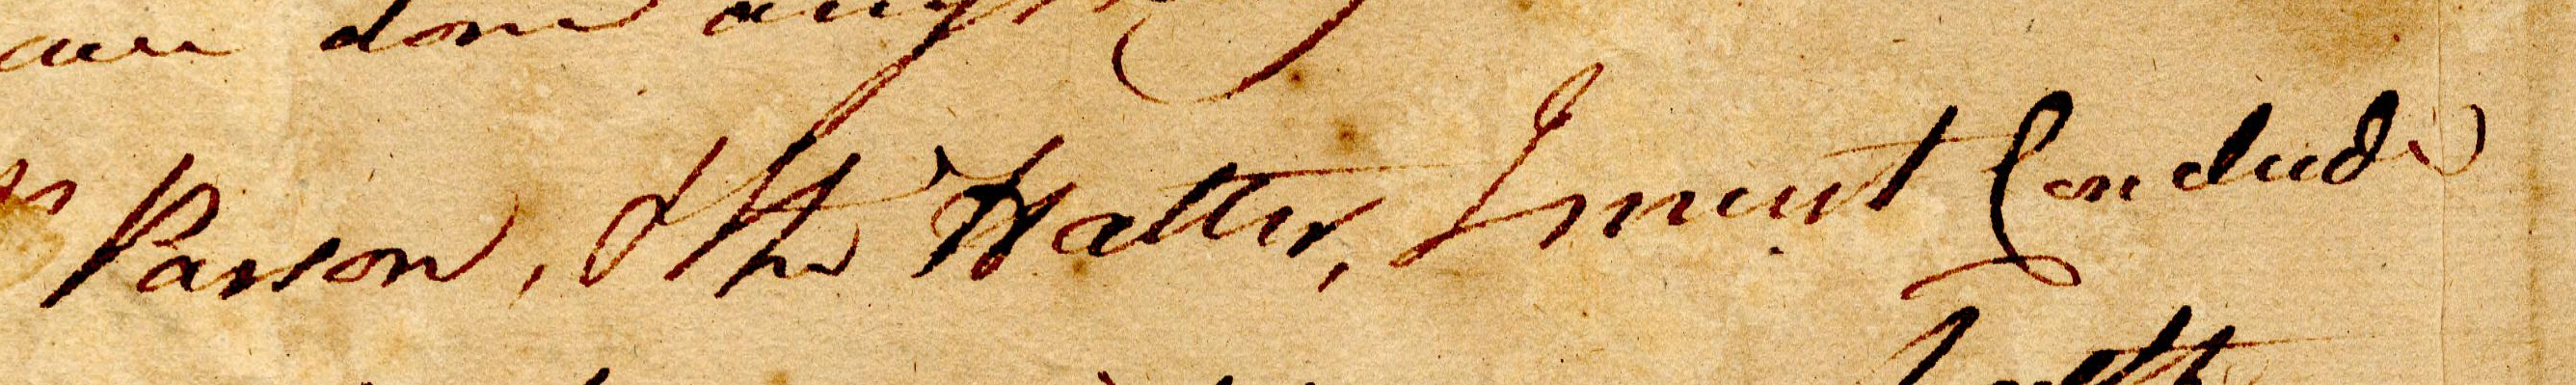Parson, & the Watter, I must Conclude
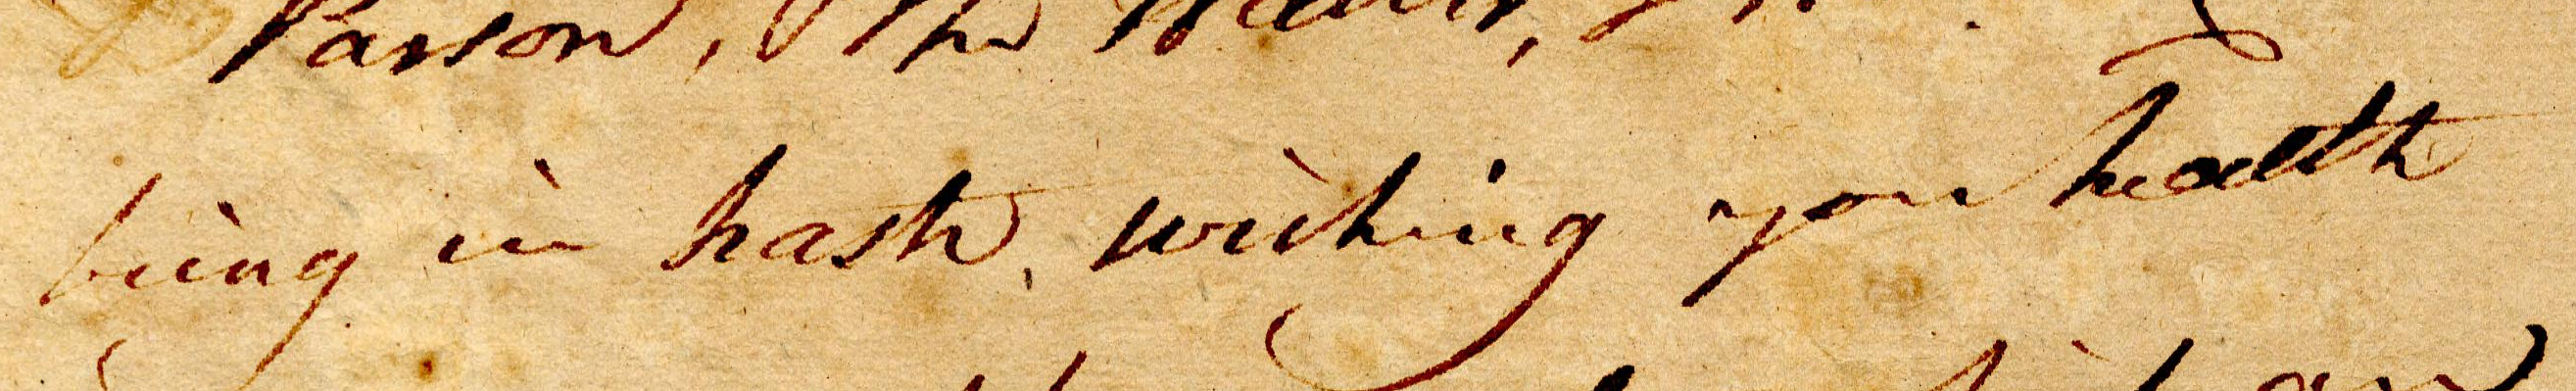breing in haste, writing you health
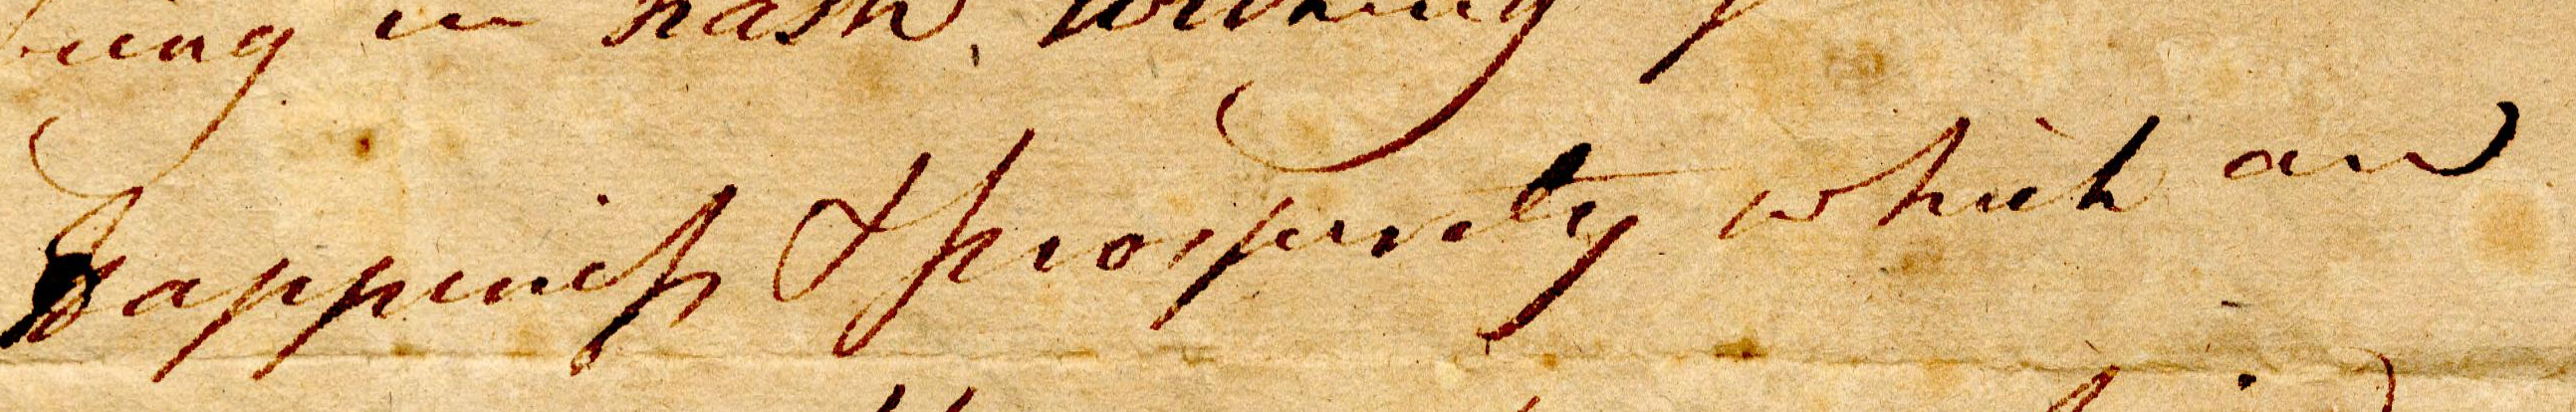happiness & prosperety which are
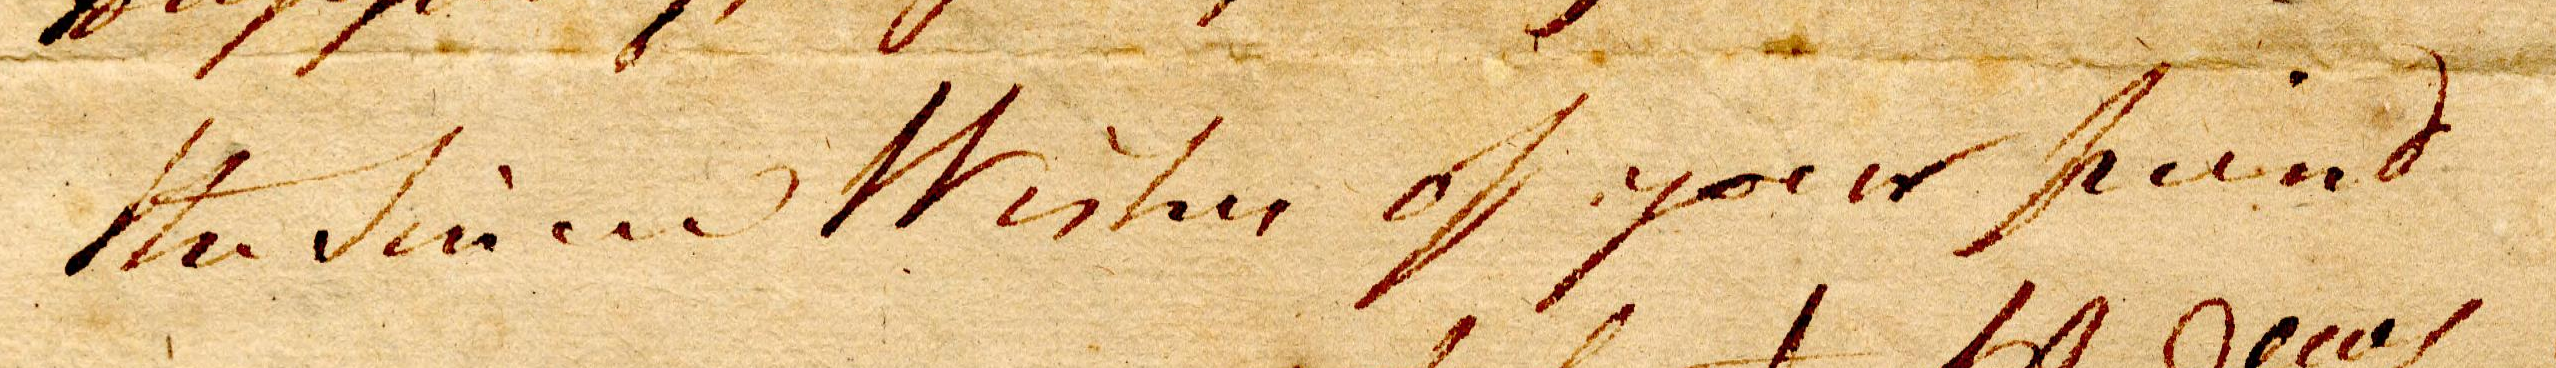the sincere Wishes of your friend
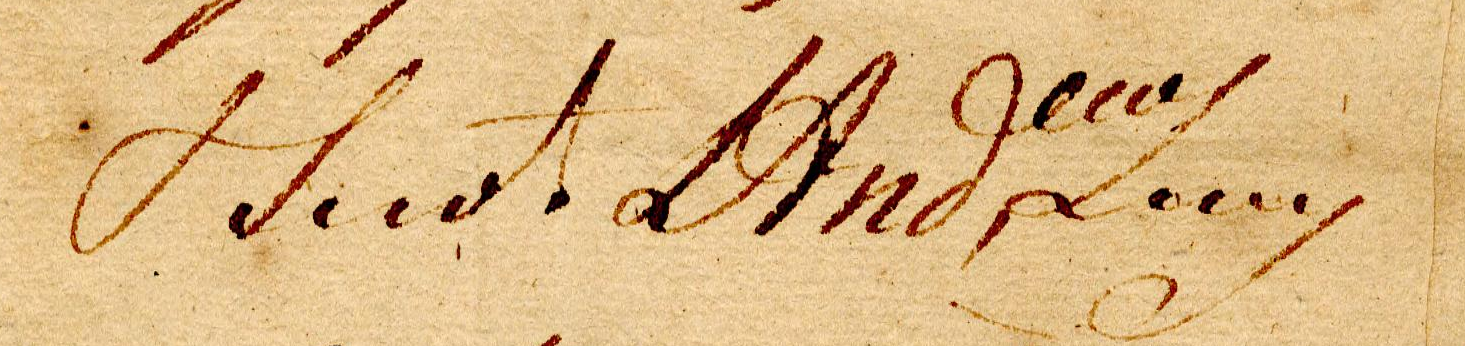& Serv^t. And^rew Levy
